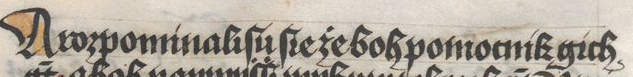A rozpominaliſu ſie że boh pomocnik gich
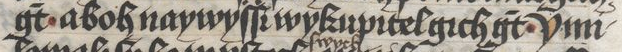ḡt.aboh naywyẛẛi wykupitel ḡt.Ymi¬
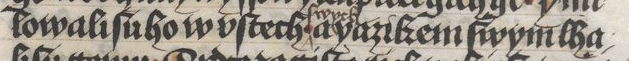lowaliſu ho w vſtech.swych a yazikem ſwym lha¬
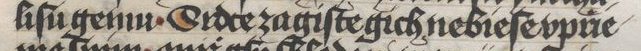liſu gemu.Srdce zagiſte gich nebieſe vpṙie¬
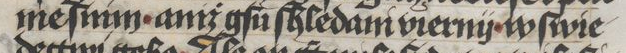meſnim.aniż gſu ſhledani viernii.wſwie¬
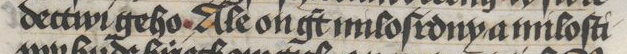dectwi geho.Ale on ḡt miloſrdny a miloſti¬
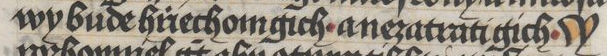wy bude hṙiechom gich.a nezatrati gich.Y
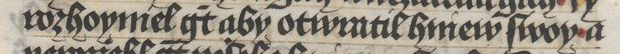rozhoyniel ḡt aby otwratil hniew ſwoy.a
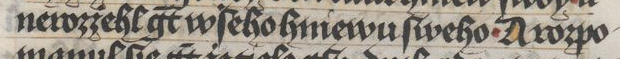nerozżehl ḡt wẛeho hniewu ſweho.A rozpo¬
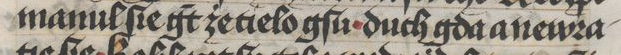manul ſie ḡt że tielo gſu.duch gda a newra¬
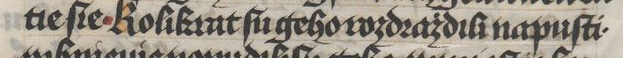tie ſe.Kolikrat ſu geho rozdrażdili napuſti.
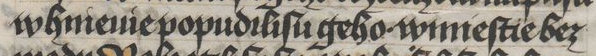whnieuie popudiliſu geho.wmieſtie bez¬
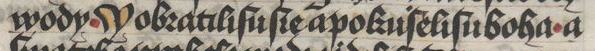wody.Y obratiliſu ſie a pokuẛeliſu boha.a
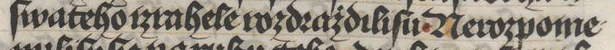ſwateho izrahele rozdrażdiliſu.Nerozpome¬
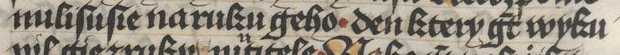nuliſuſie na ruku geho.den ktery ḡt wyku¬
